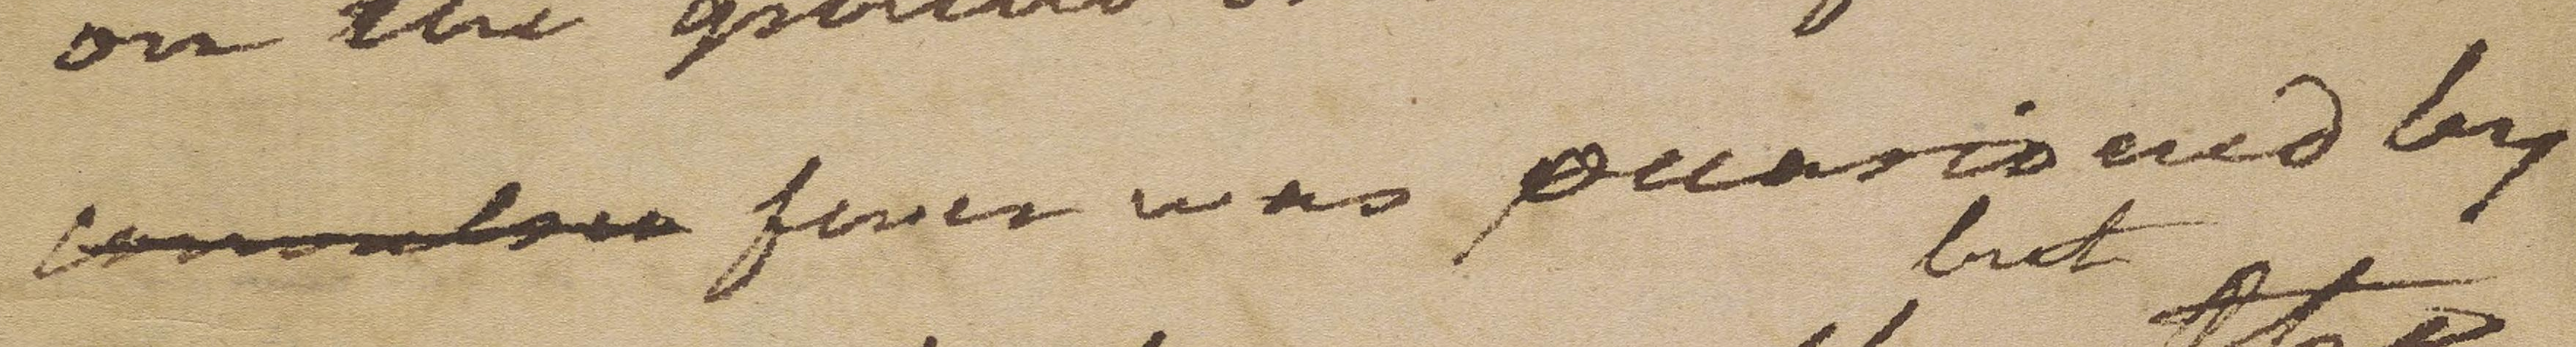[________] fever was precarisered by
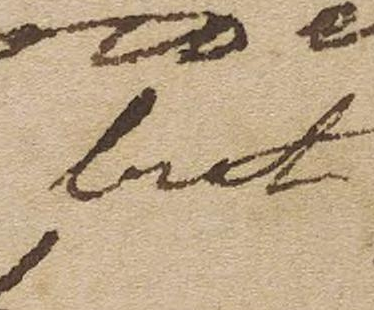but
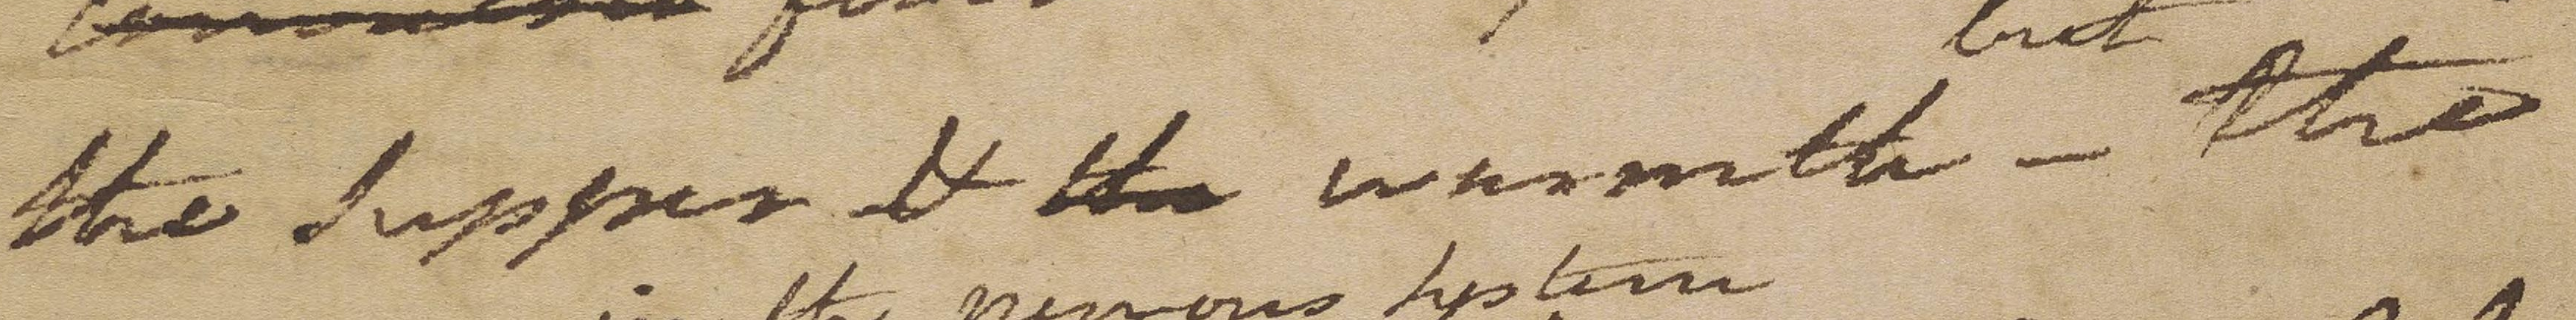the supper & [the] warmth- the
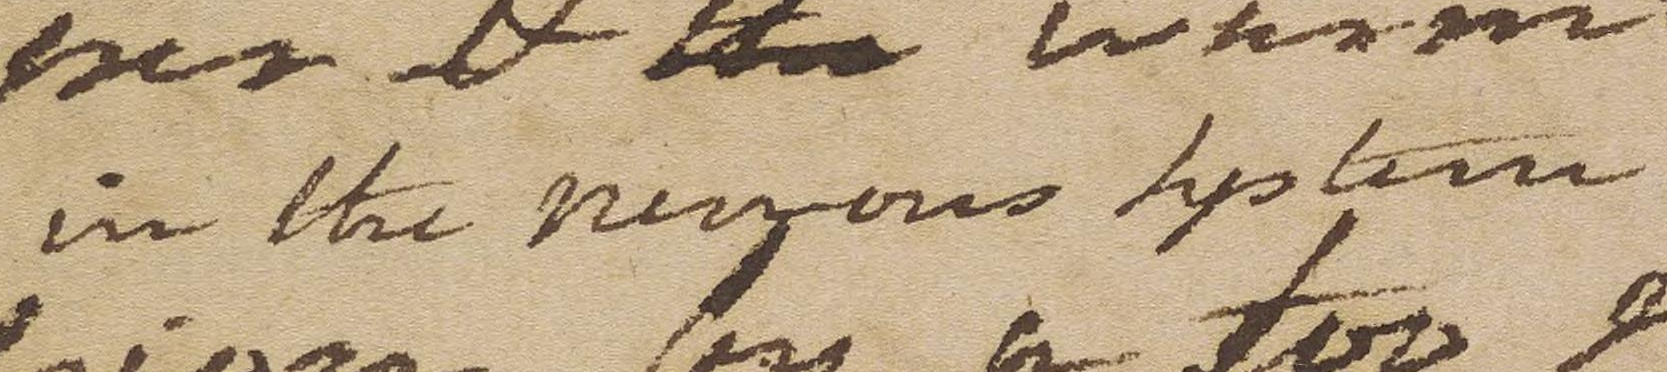in the nervous system
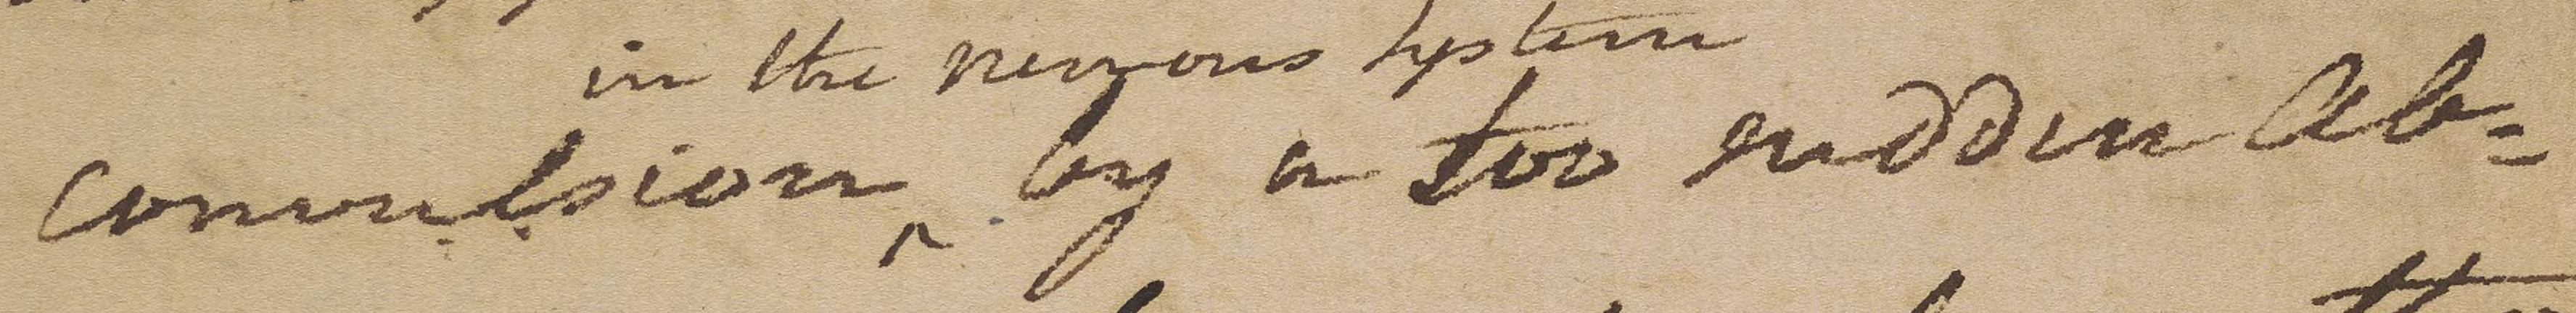convulsion ^ by a too sudden ab-
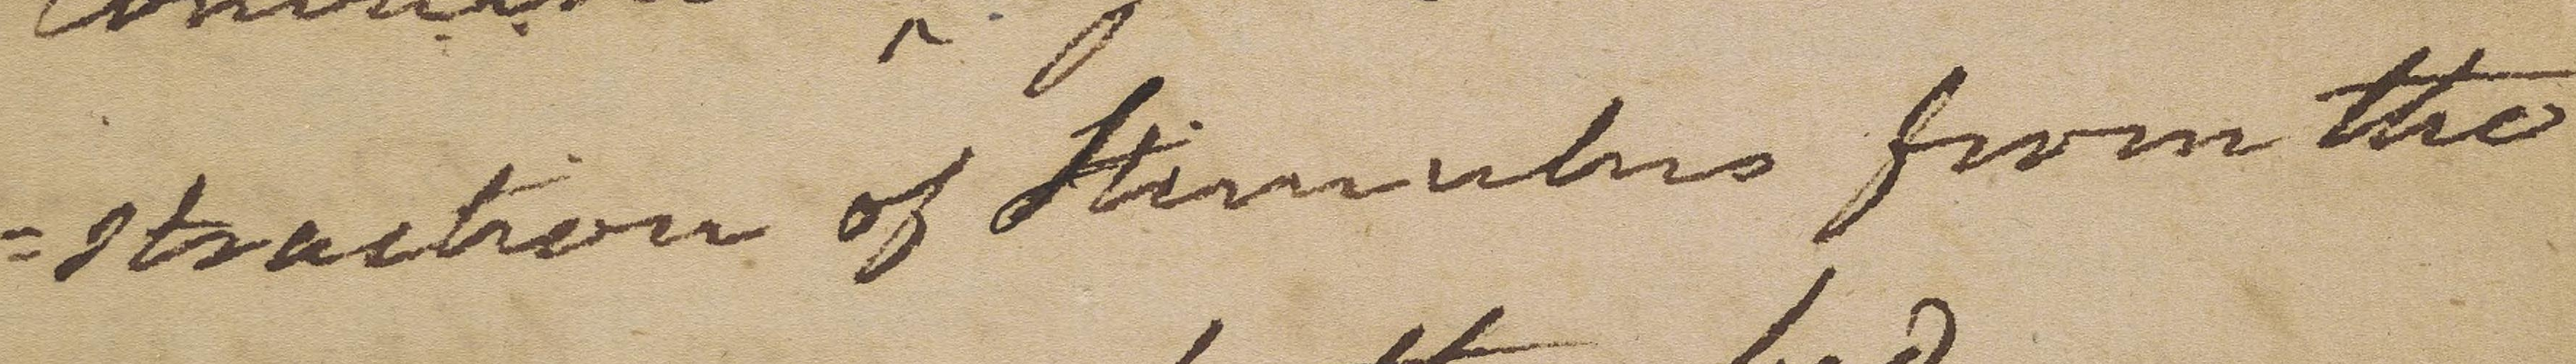-straction of stimulus from the
